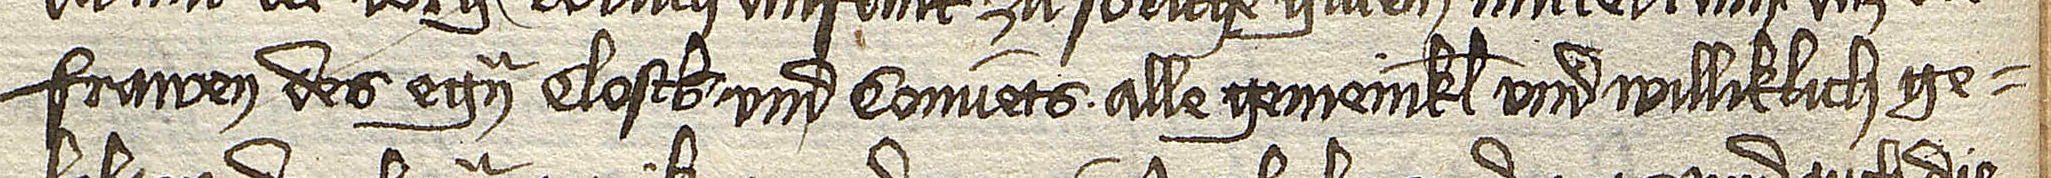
frawen des egn* Cloſt*s vnd Conu*ets . alle gemeinkl* vnd williklich ge =
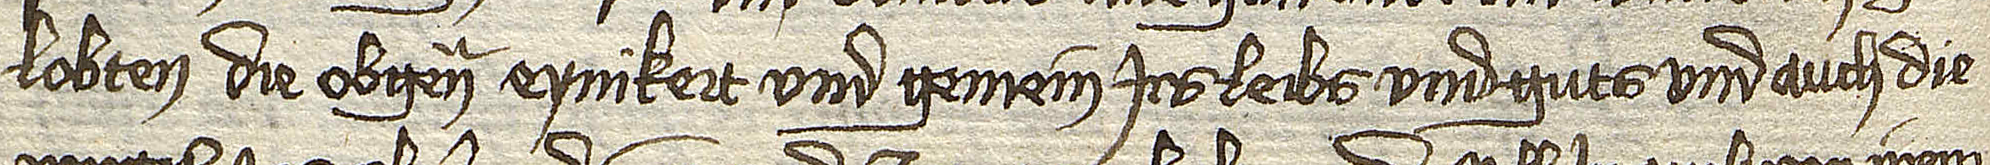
lobten die obgen* eynikeit vnd gemein Irs leibs vnd guts vnd auch die
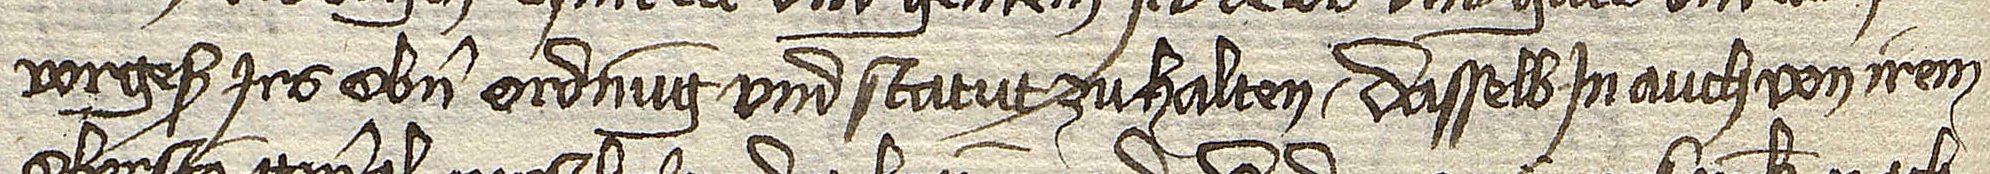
vorgeſ* Irs Obn* Ordnu*g vnd ſtatut ʒu halten / Daſſelb In auch von irem
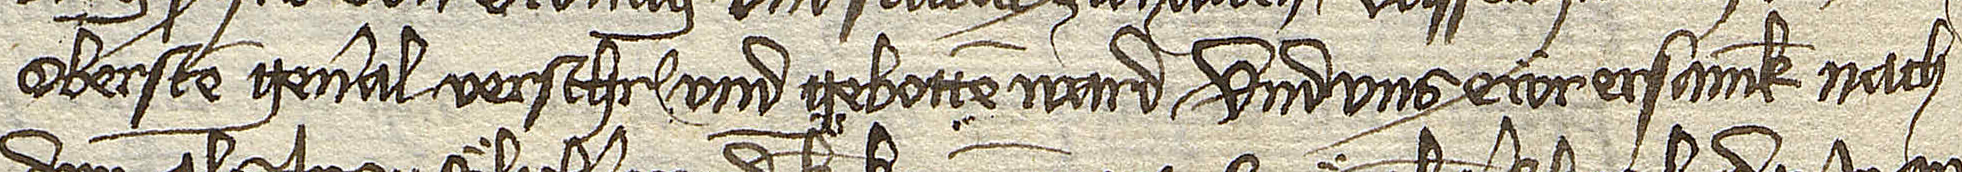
Oberſte* gen*al verſchr* vnd gebotte* ward / Vnd vns eẅr erſamk* nach
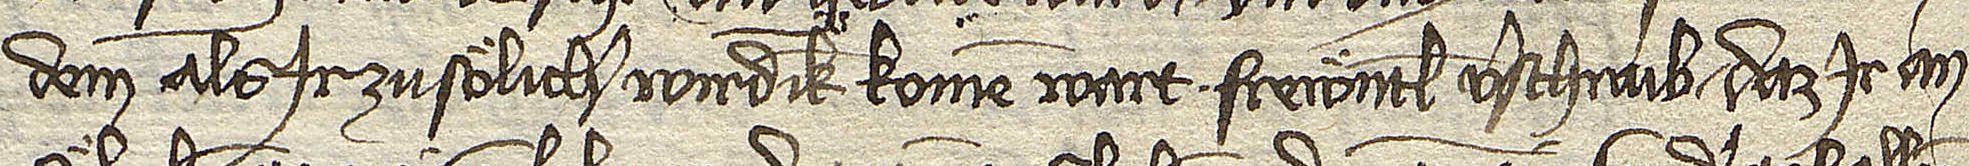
dem als Ir ʒu ſölich* wirdik* kome* wart . freẅntl* v*ſchraib / daʒ Ir an
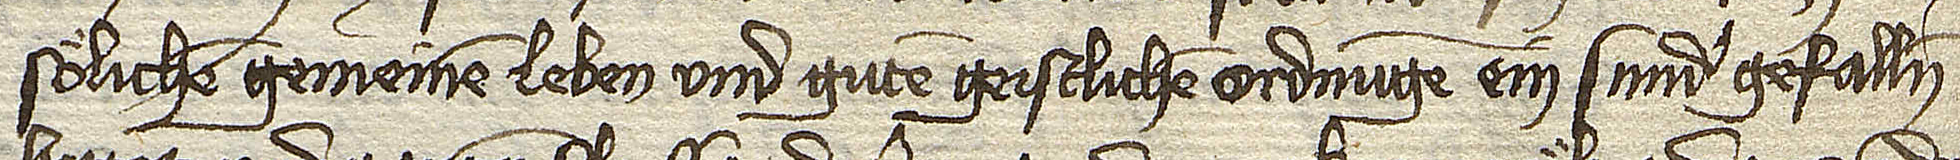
ſöliche* gemeine* leben vnd gute* geiſtliche* Ordnu*ge ein ſund* gefalln*
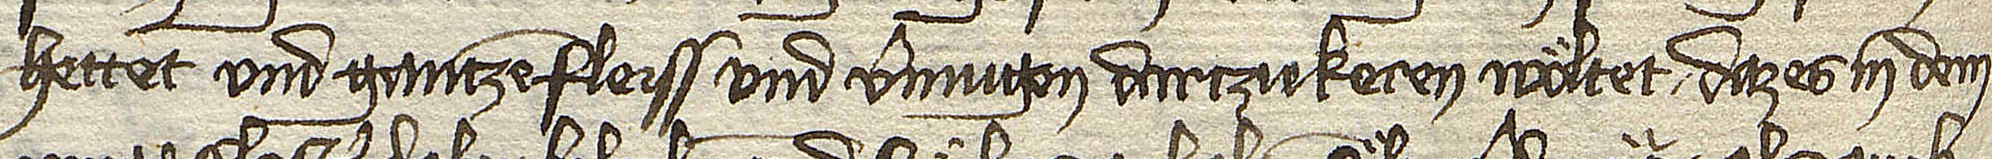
hettet vnd gancʒe* fleiſſ vnd v*mugen darcʒu keren wöltet / daʒ es in dem
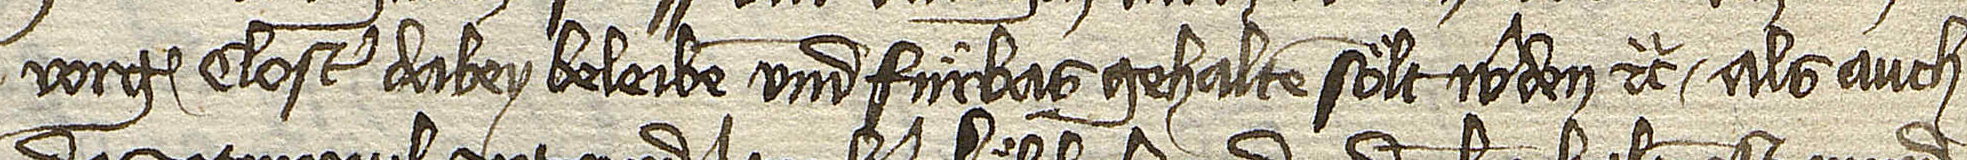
vorg* Cloſt* dabey beleibe* vnd fürbas gehalte* ſölt w*den ec* / als auch
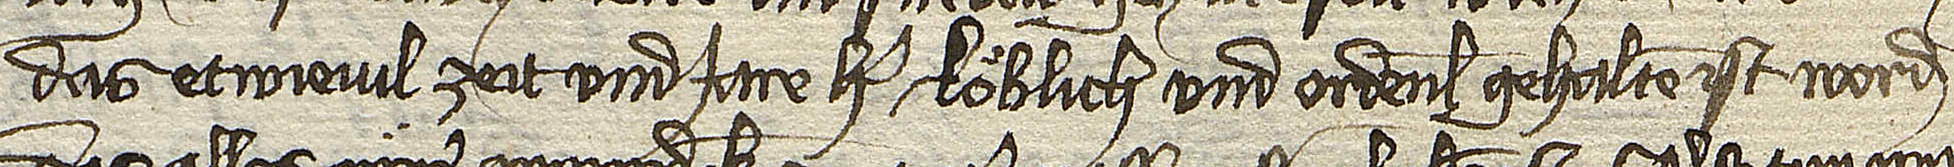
das etwieuil ʒeit vnd Iare h* / löblich vnd ordenl* gehalte* iſt word*
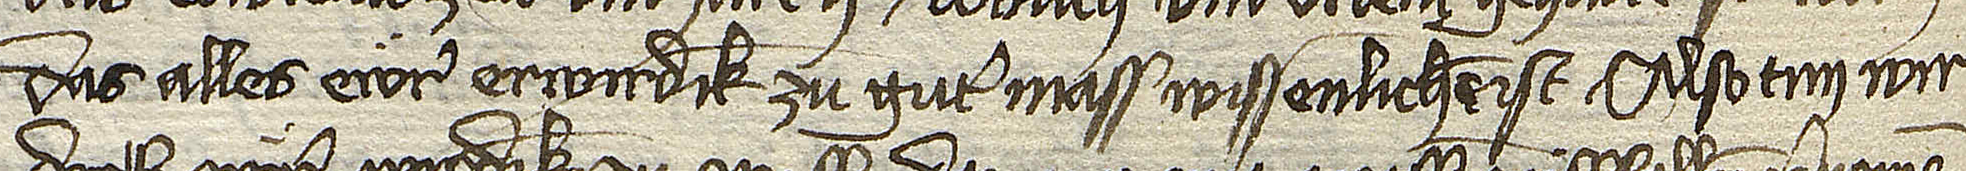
Das alles eẅr* erwirdik* ʒu gut* maſſ wiſſenlich iſt / Alſo tun wir
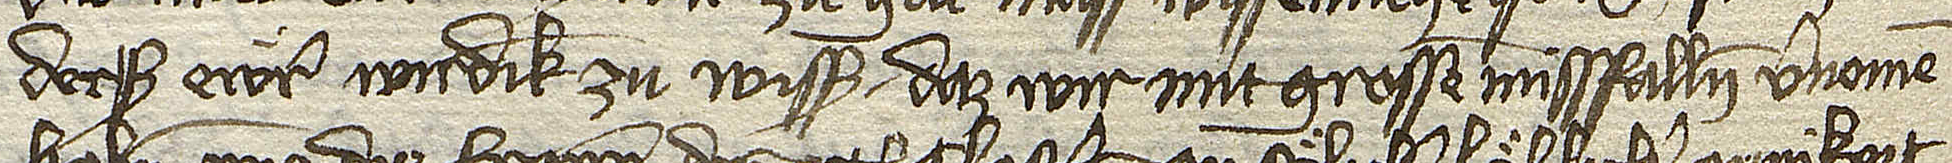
derſ* eẅr* wirdik* ʒu wiſſ* / Daʒ wir mit groſſe* miſſfalln* v*nome*
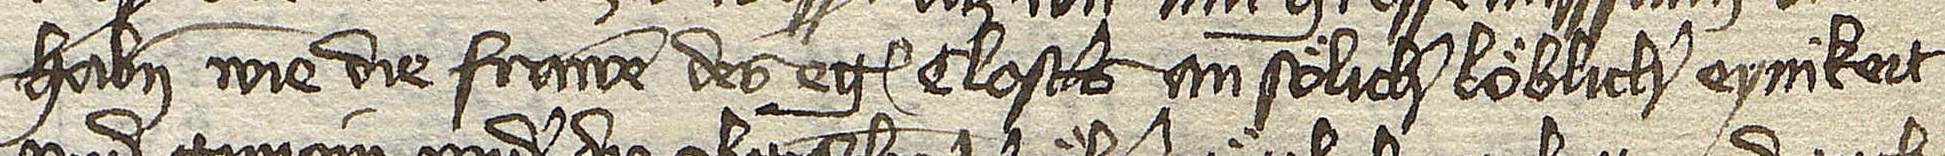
habn* wie die frawe* des eg* Cloſt*s an ſölich* löblich* eynikeit
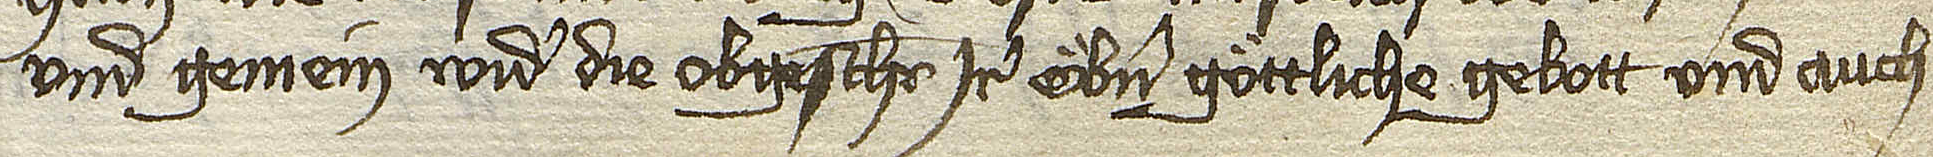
vnd gemein wid* die obgeſchr* Ir* Öbn* göttliche gebott vnd auch
